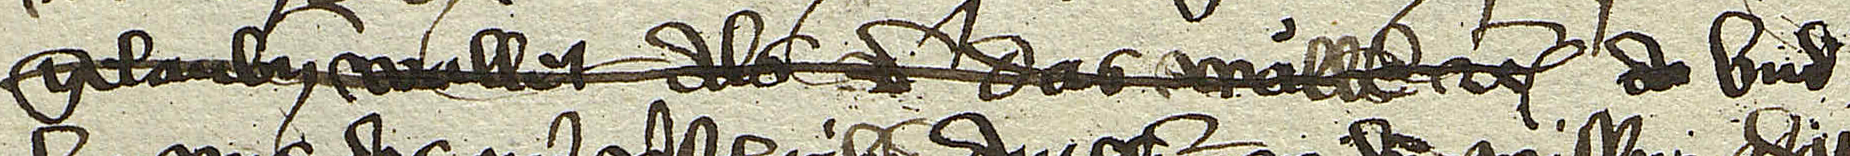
gelaubn* wollet Als ec* das wölle* ec* A vnd
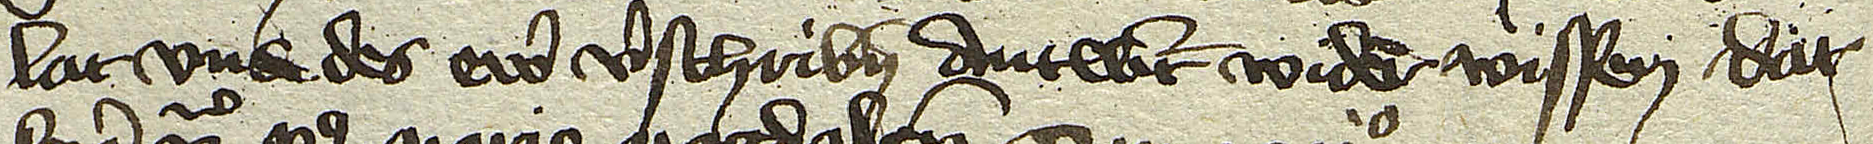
lat vns des ew* v*ſchribn* Antwt* wider wiſſen / dat*
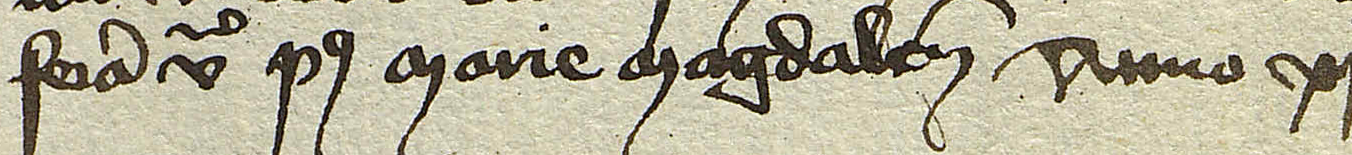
feia* v* p* Marie Magdalen* / Anno xi*
